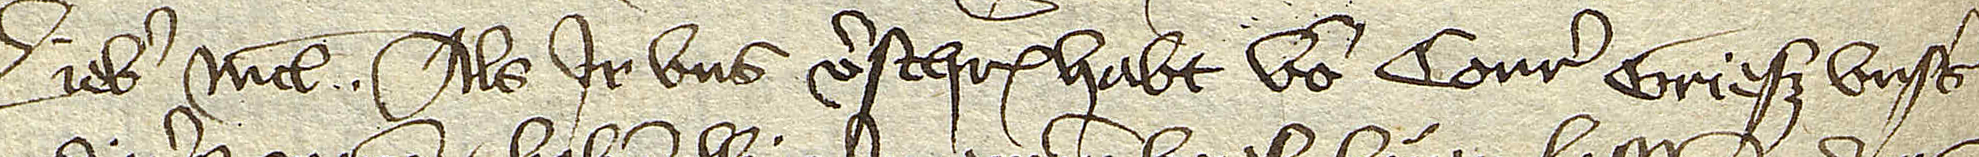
Lieb* Nicl* . Als Ir vns v*ſchr* habt vo* Conr* Grieſʒ vnſs*
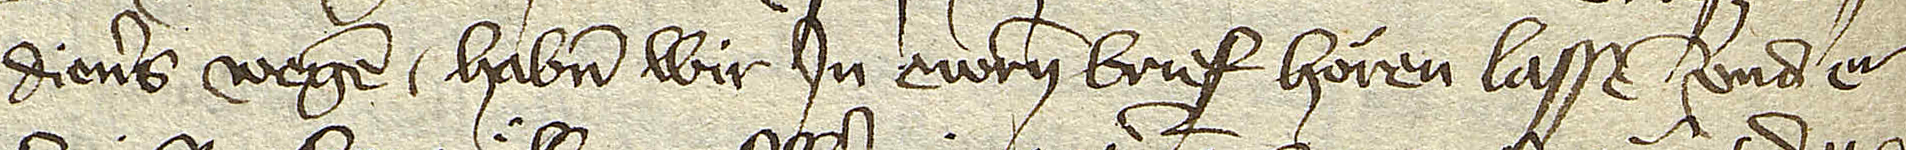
dien*s wege* / habn* wir In ewrn* brief hören laſſe* / vnd er
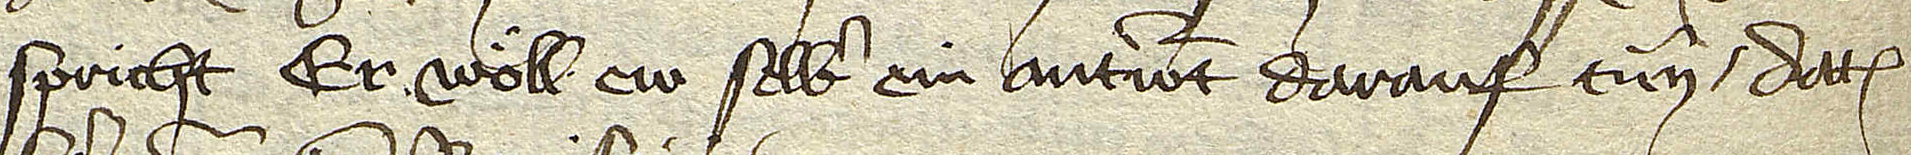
ſpricht Er wöll ew ſelb* ein antw*t darauf tün / dat*
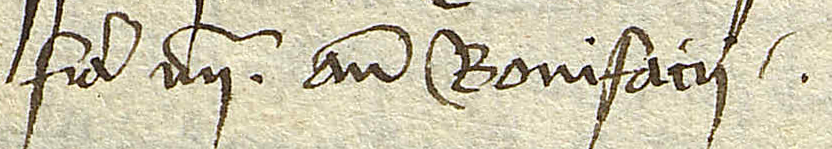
fia* iiii* . an* Bonifacii / .
